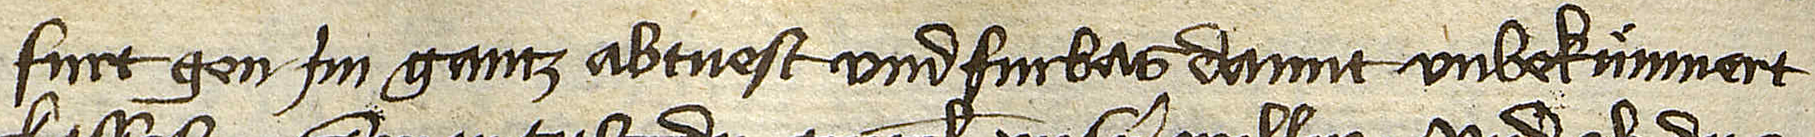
furt gen Im gancʒ abtueſt vnd furbas damit vnbekümnert
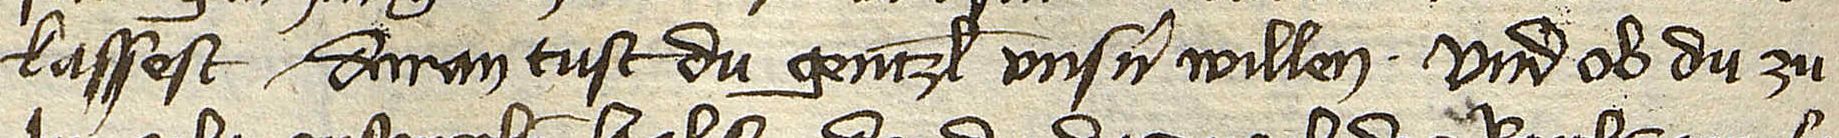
laſſeſt / daran tuſt du gencʒl* vnſn* willen Vnd ob du ʒu
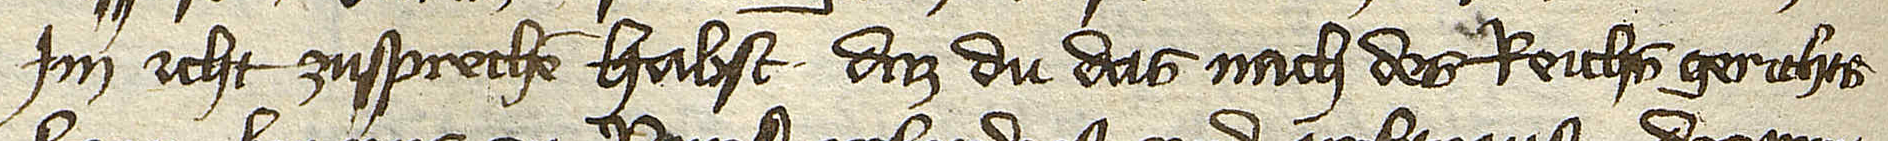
Im icht ʒuſpreche* habſt . daʒ du das nach des Reichs gerichts
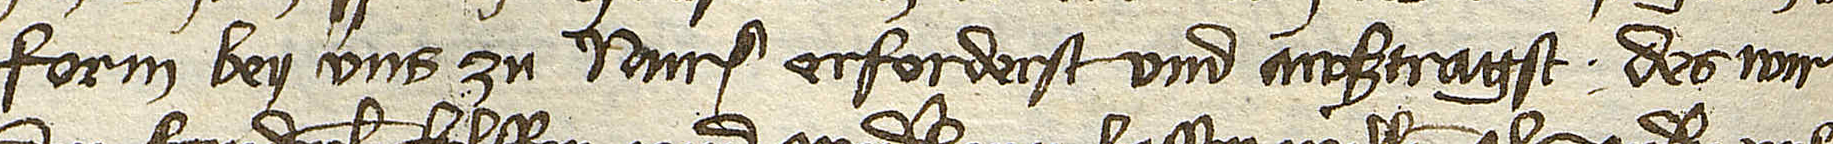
form bey vns ʒu Nur* erforderſt vnd awſʒtragſt . des wir
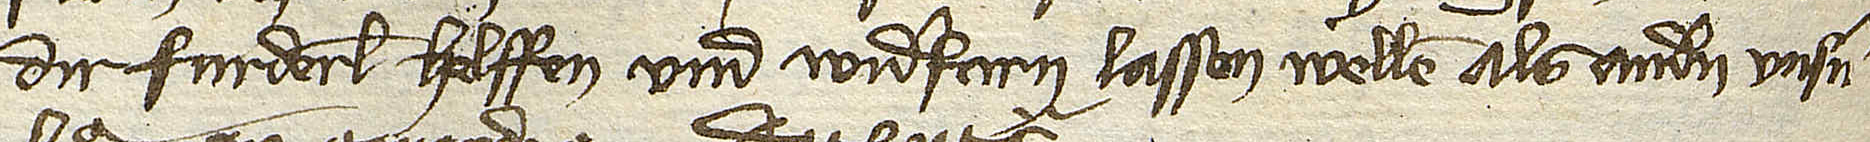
dir furderl* helffen vnd wid*farn laſſen welle* als andn* vnſn*
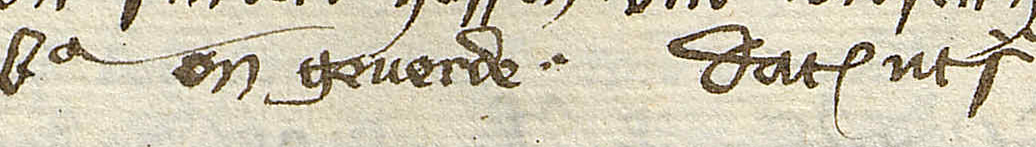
b* on geuerde . Dat* ut ſ*
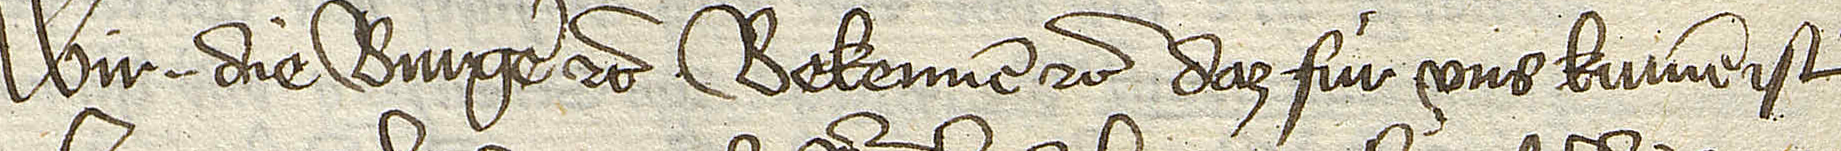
Wir ~ die Burge* ec* Bekenne* ec* daʒ für vns kume* iſt
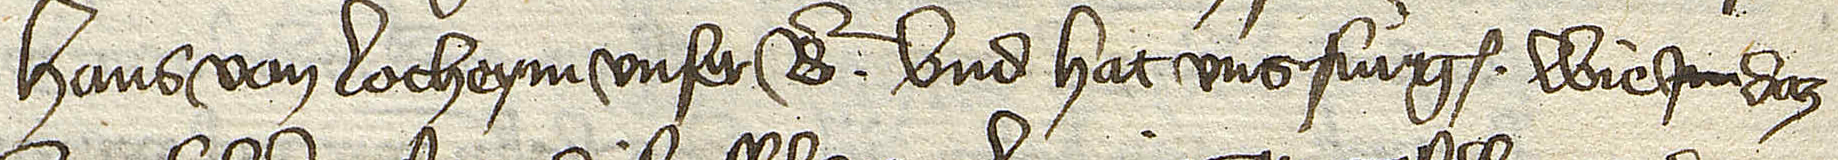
Hans von Locheym vnſer B* . vnd hat vns fürg*. wie Im daʒ
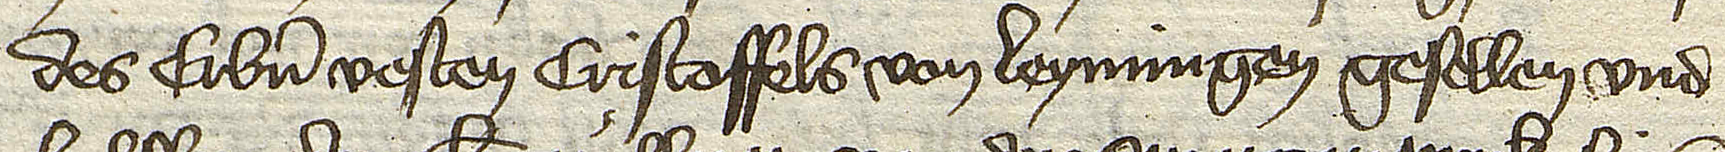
des Erbn* veſten Criſtoffels von leymingen geſellen vnd
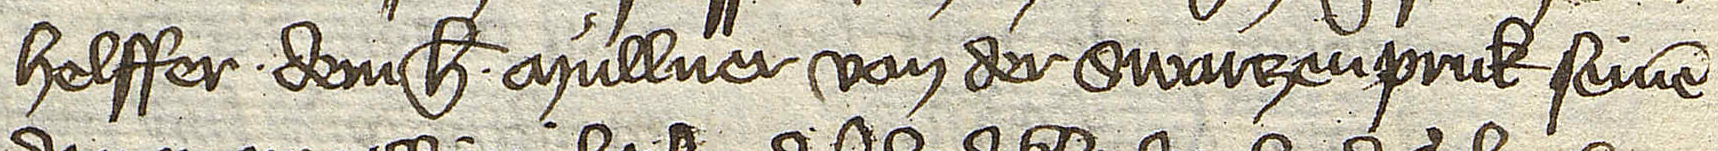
helffer . dem H* Müllner von der Swarcʒenpruk ſeine*
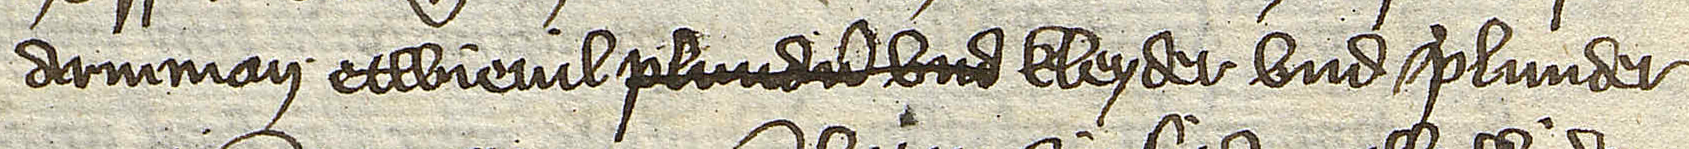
Armman etwieuil plundn* vnd kleyder vnd plunder
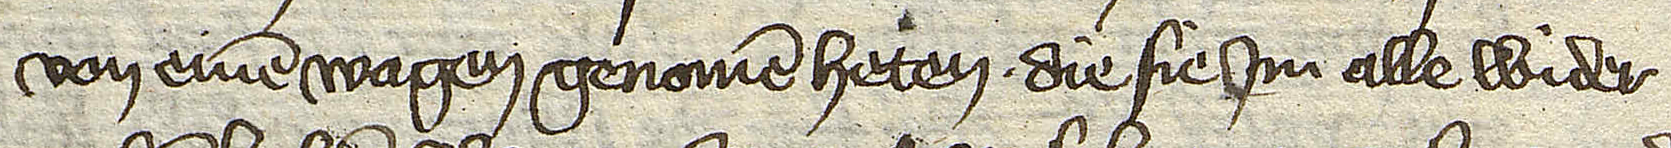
von eine* wagen genome* heten . die ſie Im alle wider
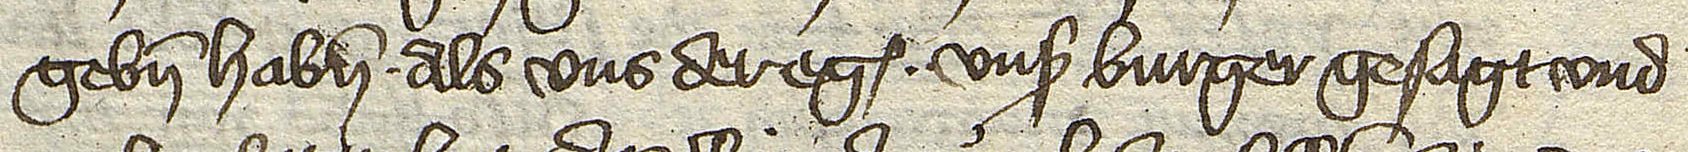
gebn* habn* . Als vns der eg*. vnſ* burger geſagt vnd
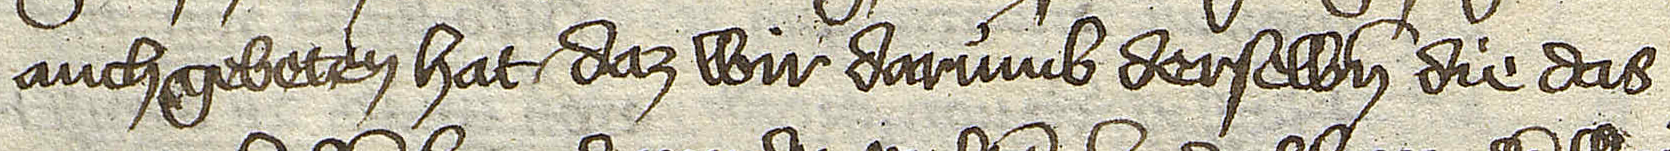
auch gebeten hat / daʒ wir darümb derſelbn* die das
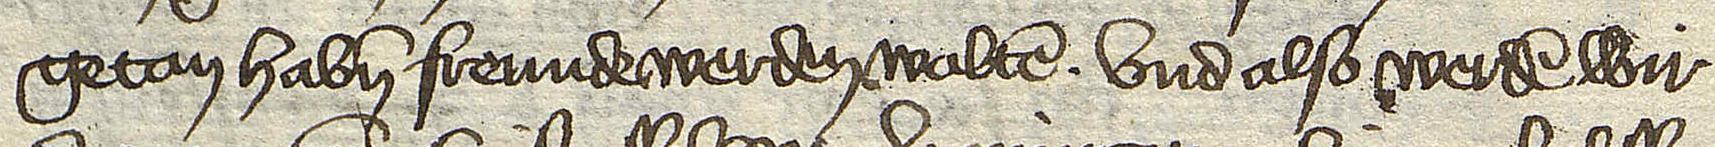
getan habn* freunde werden wolte* . vnd alſo werd* wir
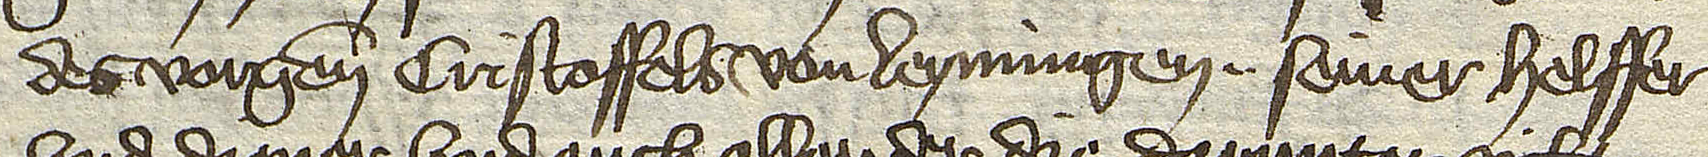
des vorgen* Criſtoffels von leymingen ~ ſeiner helffer
